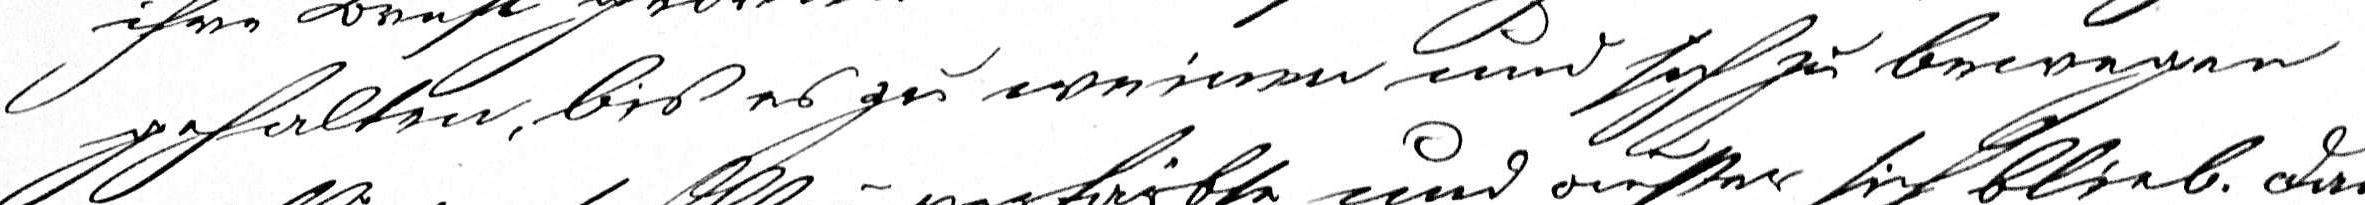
gehalten, bis es zu weinen und soch zu bewegen
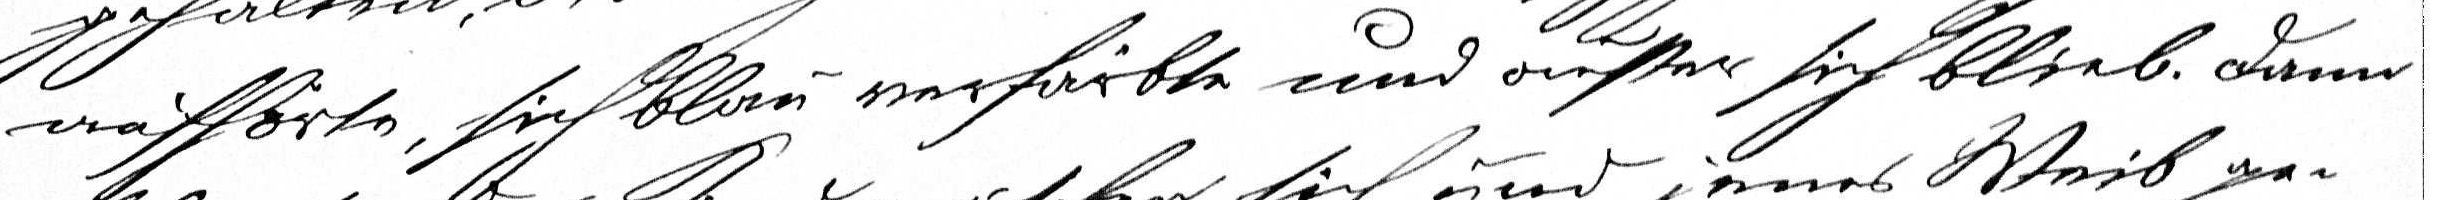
vafförte, sich blau verfärbte und arster sich blieb. dann
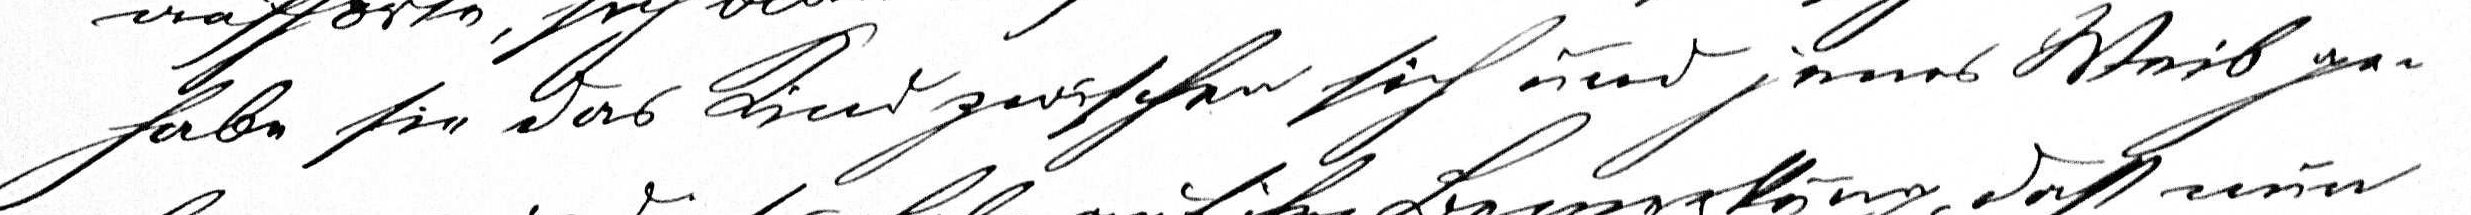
Habe sie das Kind zwischen sich und janes Weis ge¬
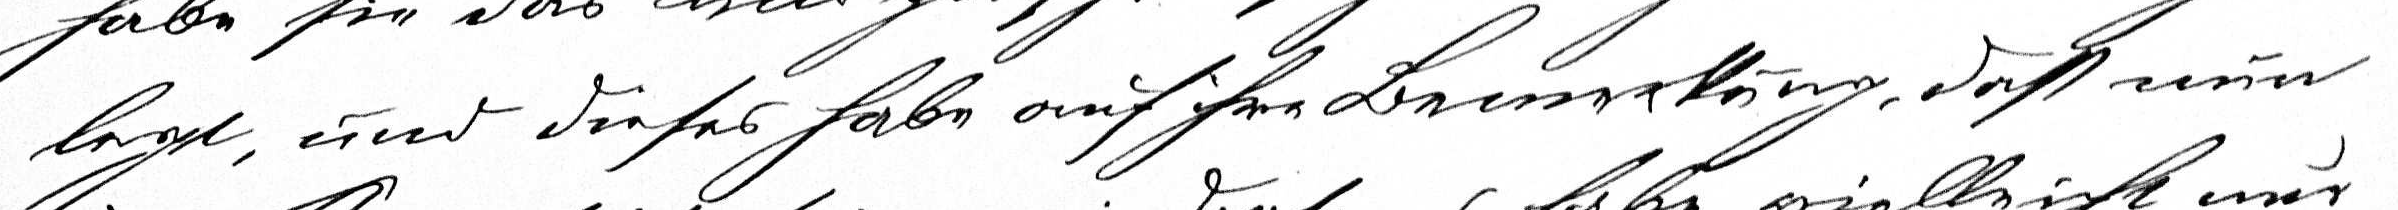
lagt, und dieses habe auf fre bemerkung, daß nun
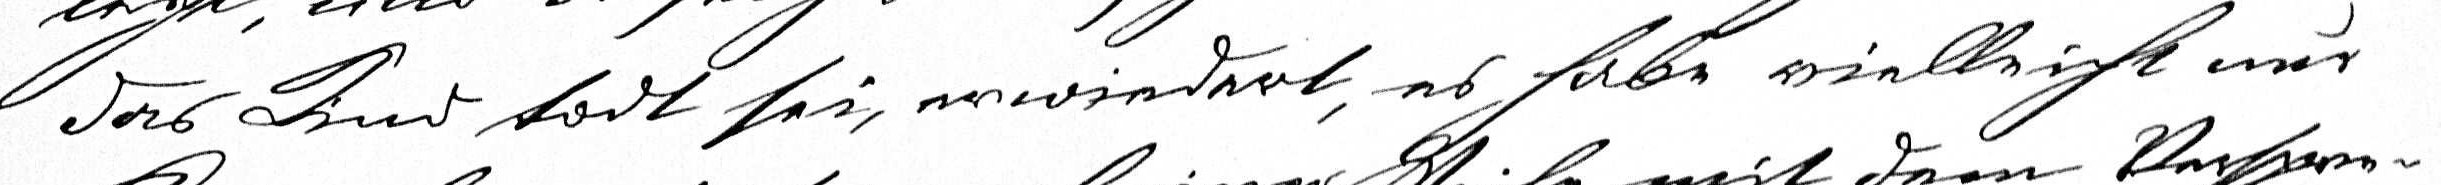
das kind todt sei, erwiedert, es habe wielleicht wur
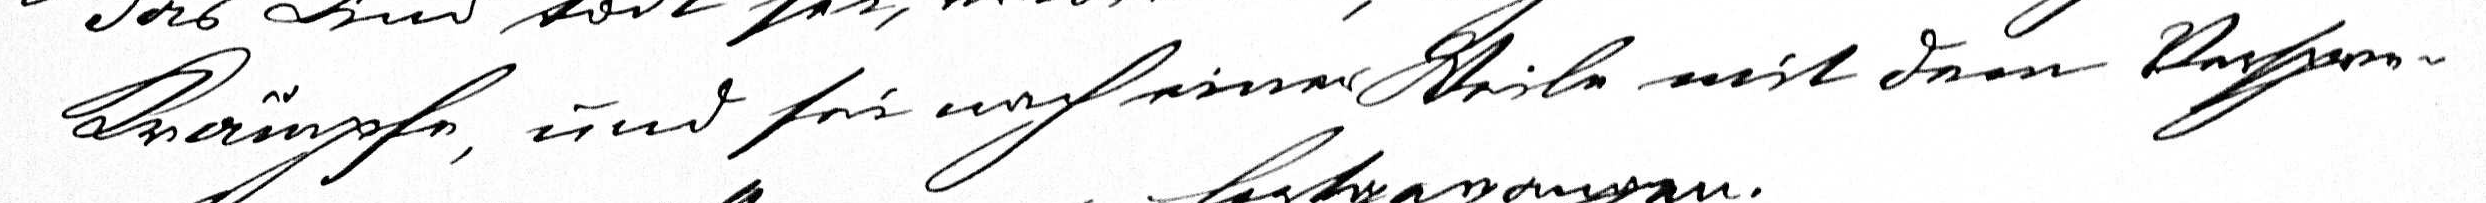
Krämpfe, und sei nach einer Weile mit dem Verspre¬
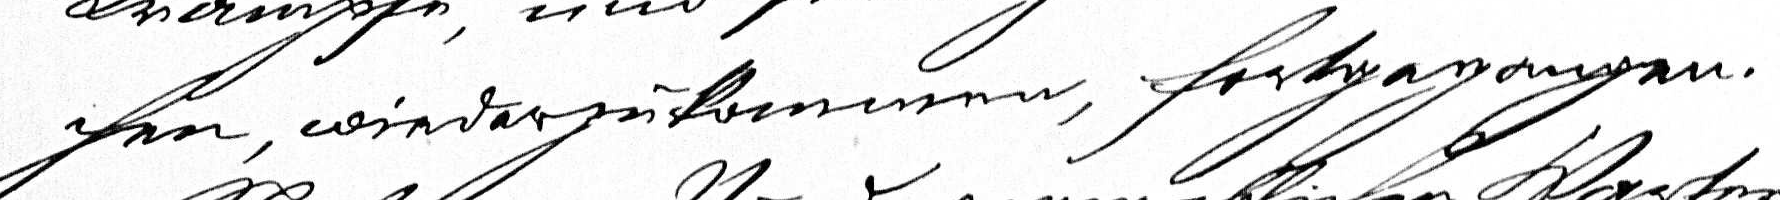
chen, wiederzukommen, fortpagangen.
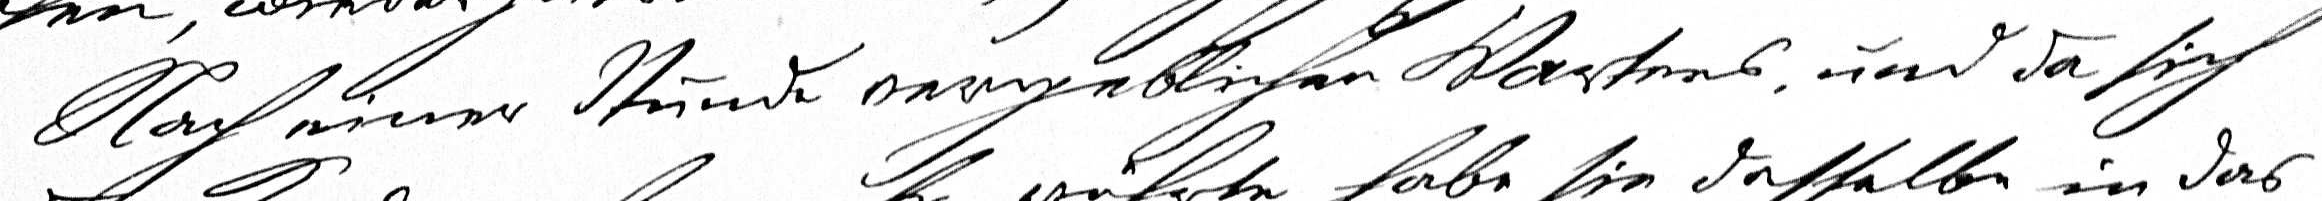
Nach einer Stunde vergeblicher Warters, und da sich
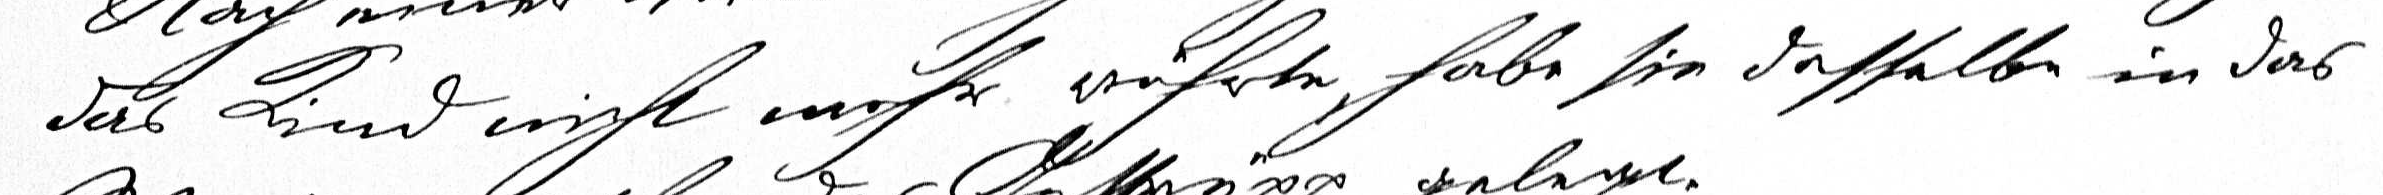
das Kind nicht mehr vöfrte, habe sie dasselbe in das
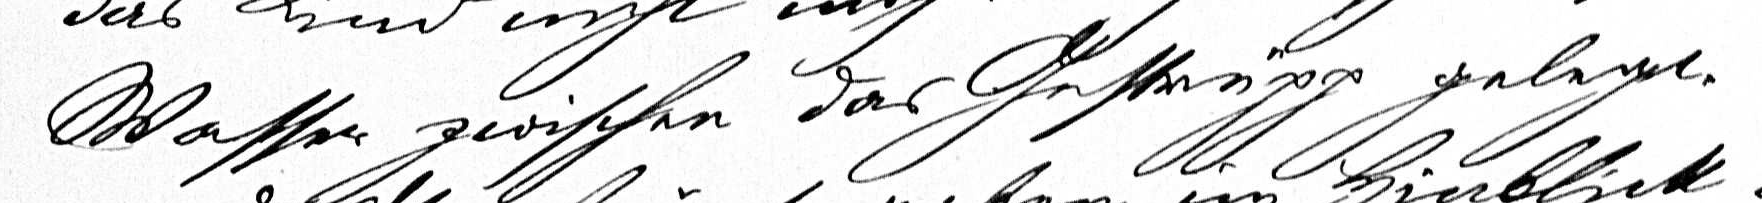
Wasser zwischen das Gestrüpp gelege
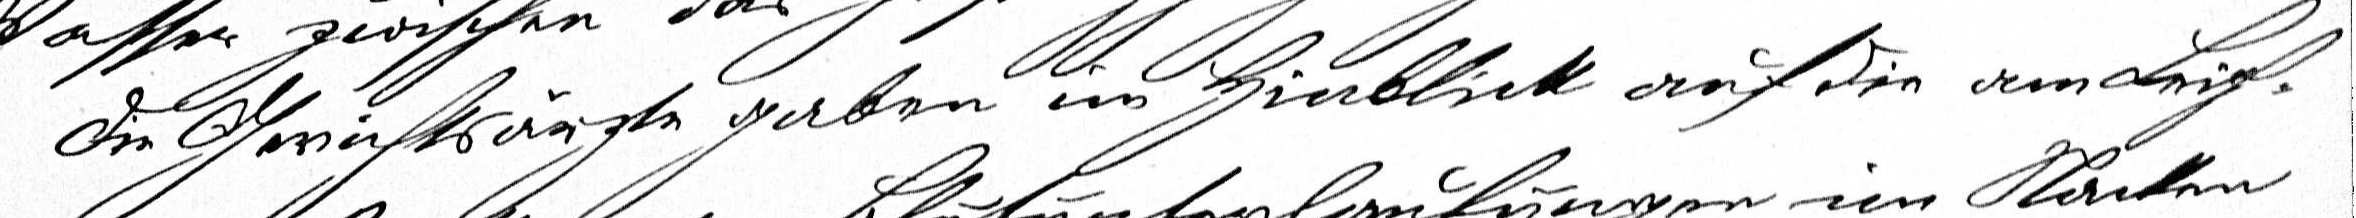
die Gerichtsauzte gaben in hiablick auf die am leif¬
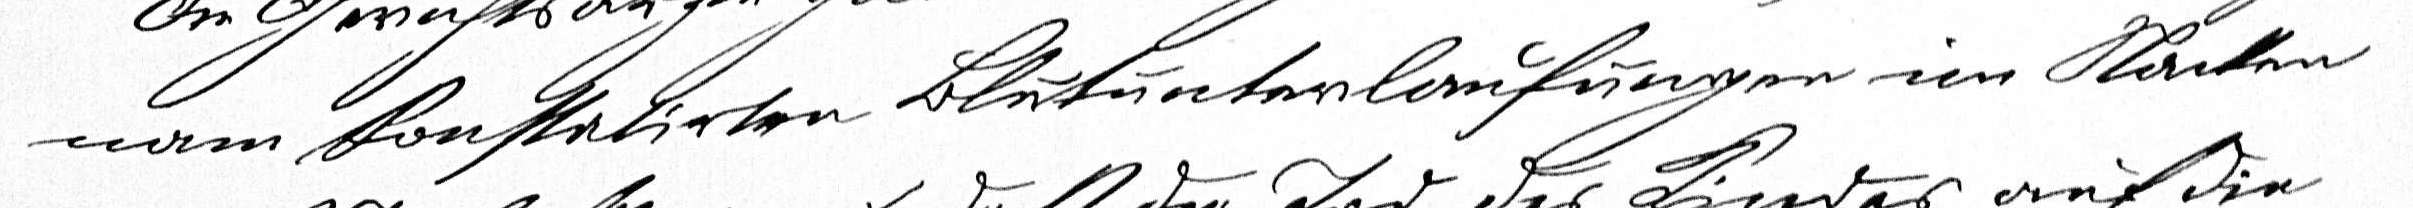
nam Konstatirten Blutuntenlaufungen im Nacken
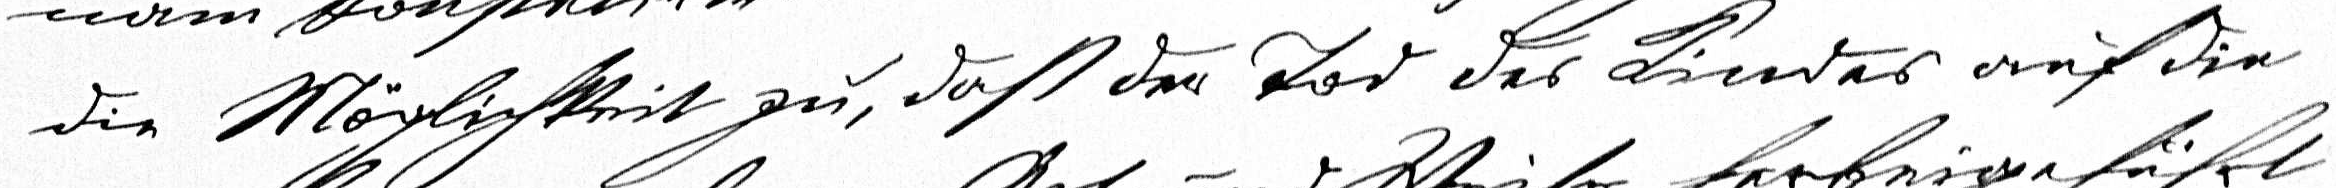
die Möglichkeit zu, daß der tod des Kindes auf die
